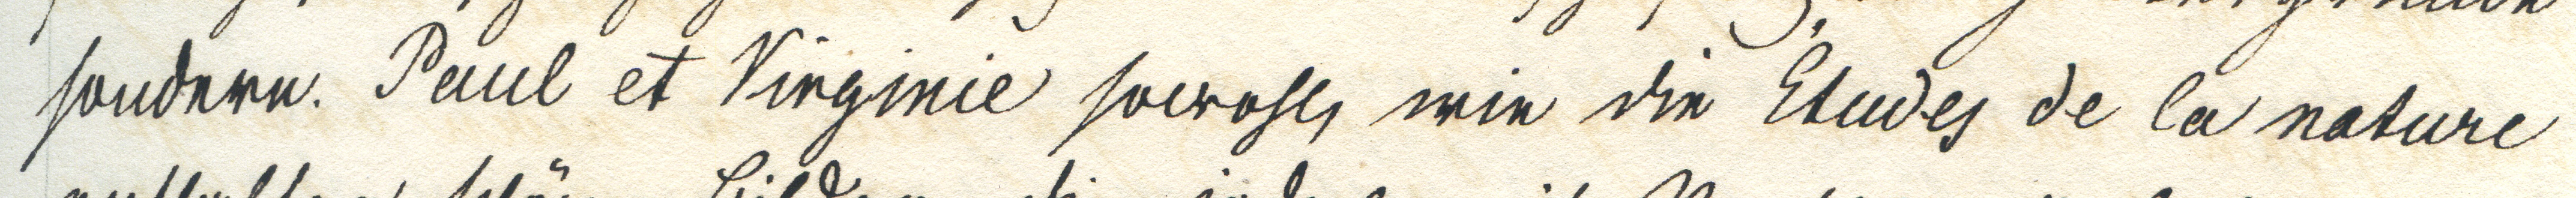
sondern. Paul et Virginie sowohl, wie die Etudes de la nature
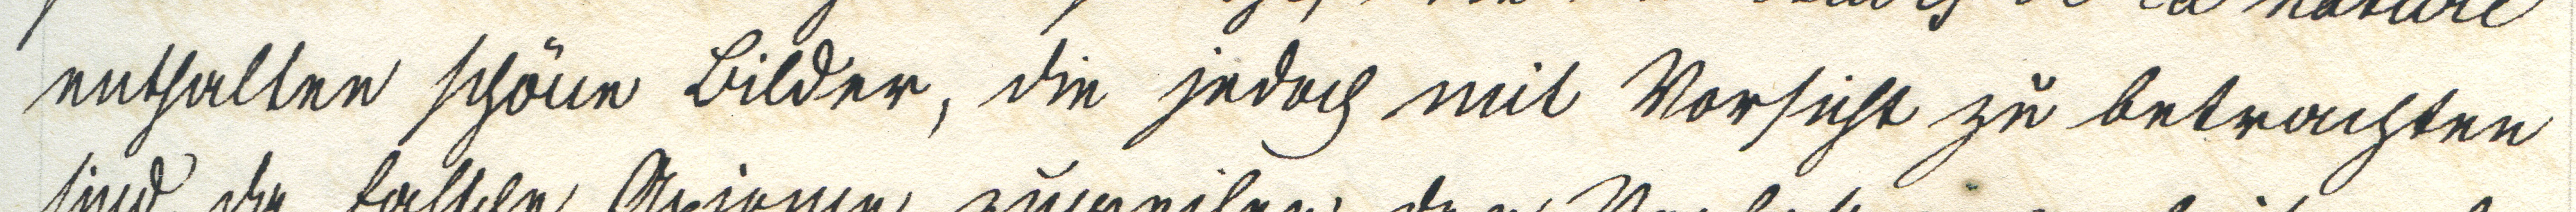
enthalten schöne Bilder, die jedoch mit Vorsicht zu betrachten
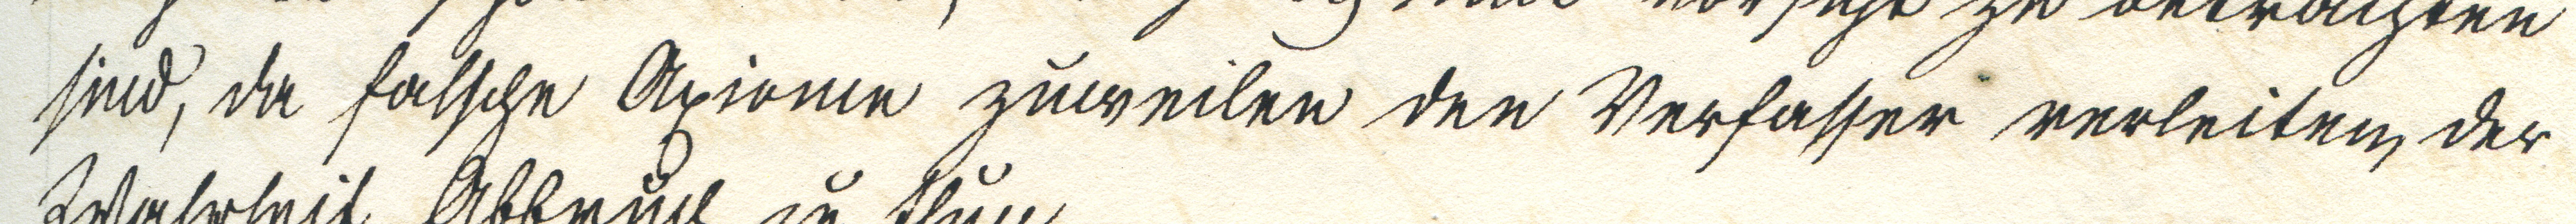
sind, da falsche Axiome zuweilen den Verfasser verleiten, der
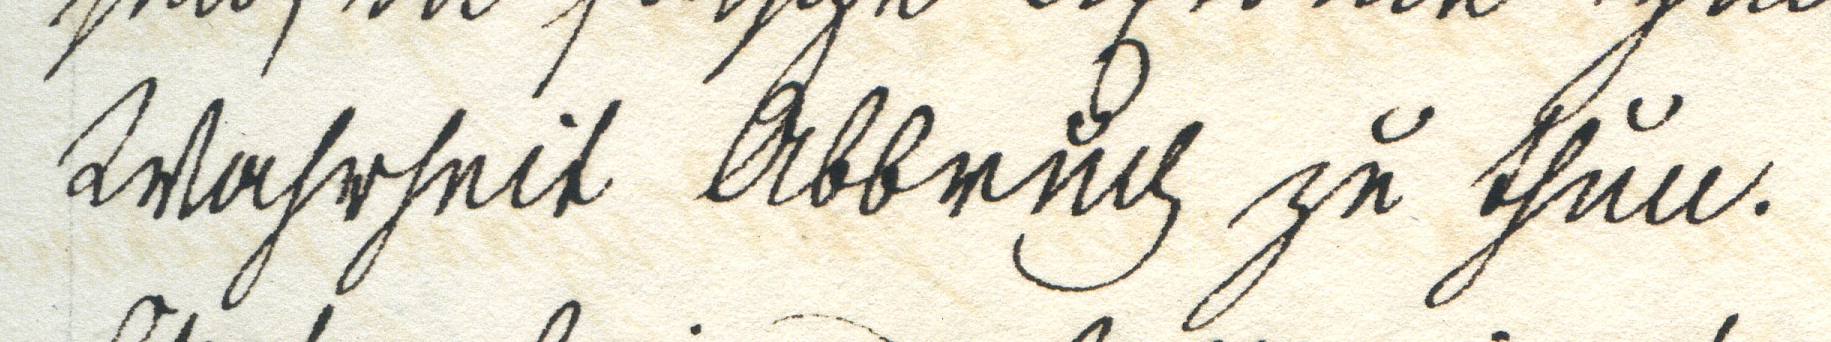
Wahrheit Abbruch zu thun.
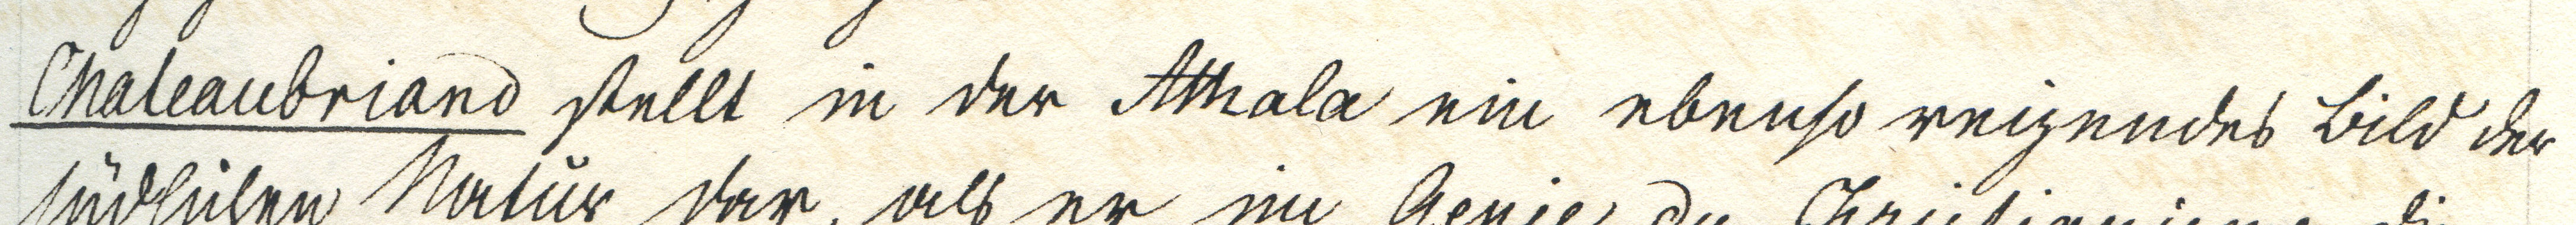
Chateaubriand stellt in der Athala ein ebenso reizendes Bild der
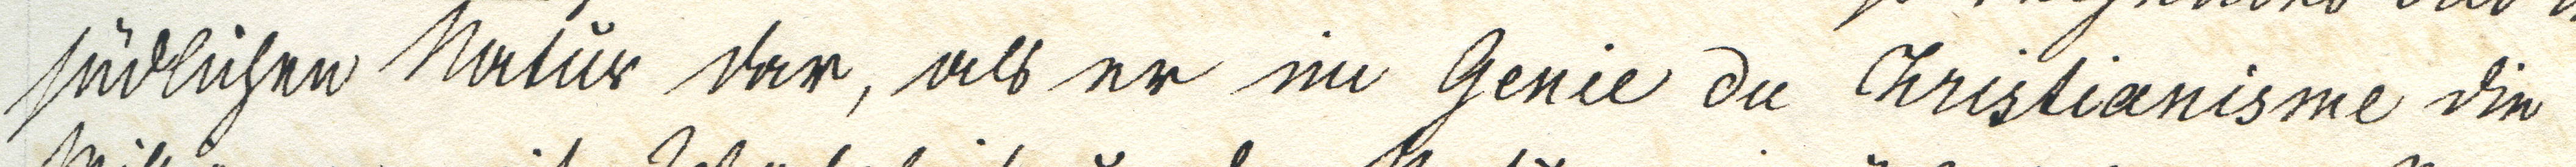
südlichen Natur dar, als er im Genie du Christianisme die
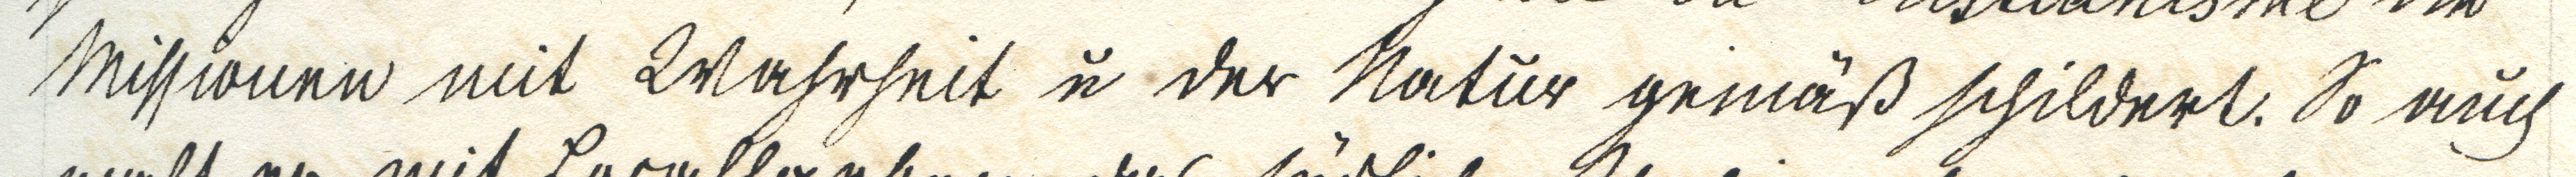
Missionen mit Wahrheit u der Natur gemäß schildert. So auch
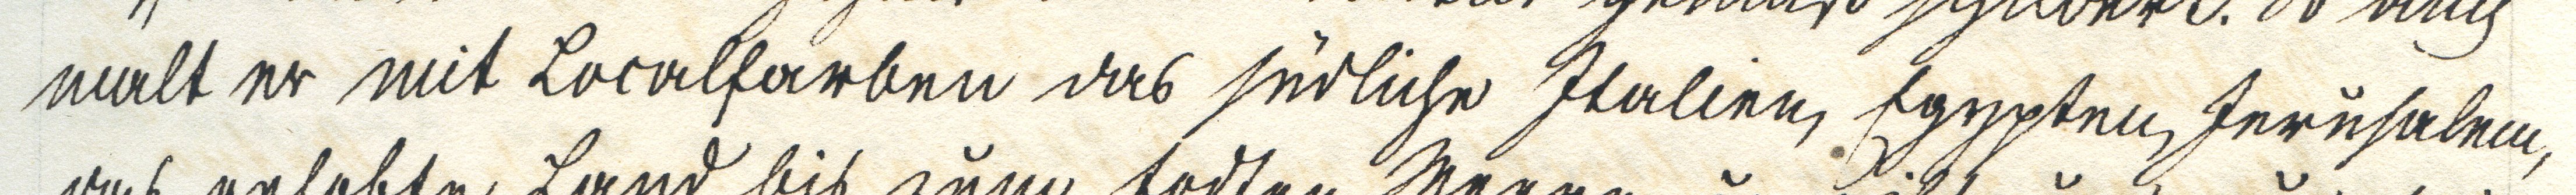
malt er mit Localfarben das südliche Italien, Egypten, Jerusalem,
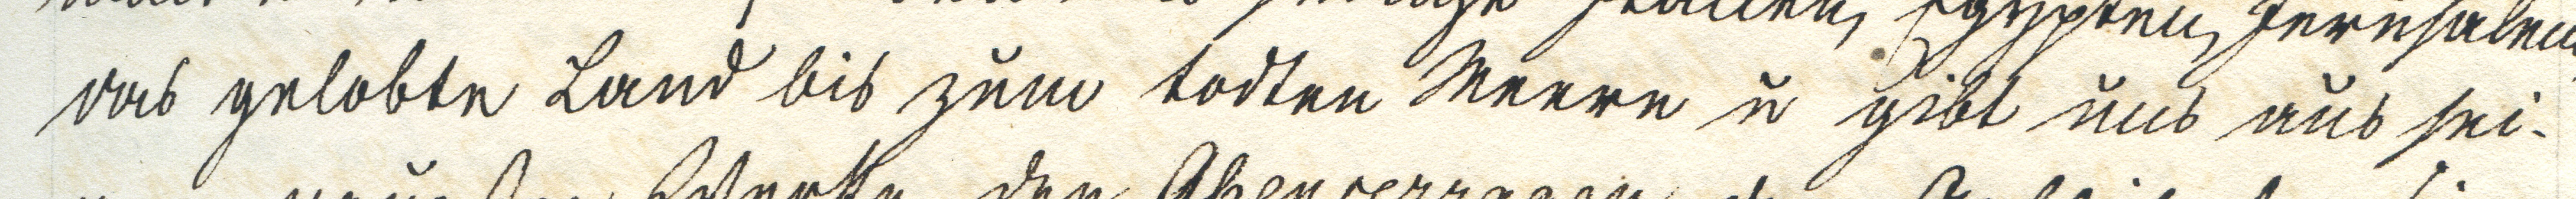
das gelobte Land bis zum todten Meere u gibt uns aus sei-
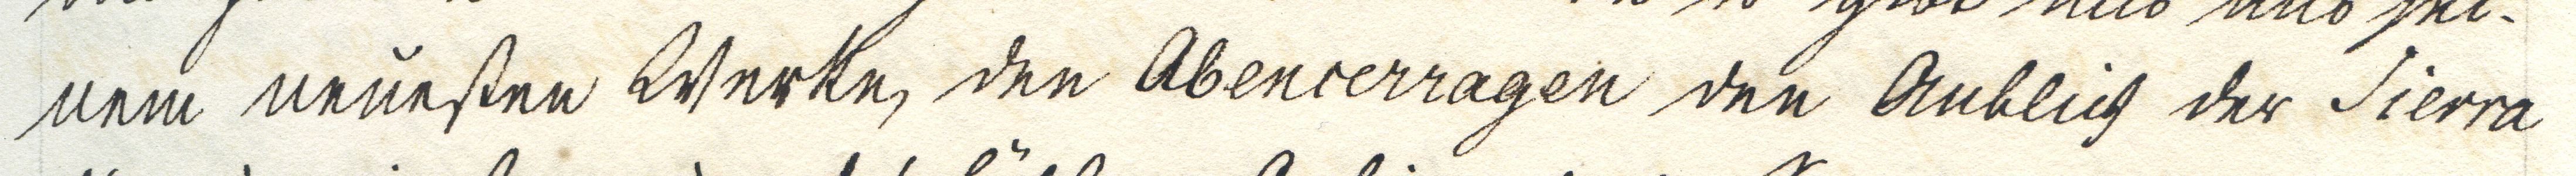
nem neuesten Werke, den Abencerragen den Anblick der Sierra
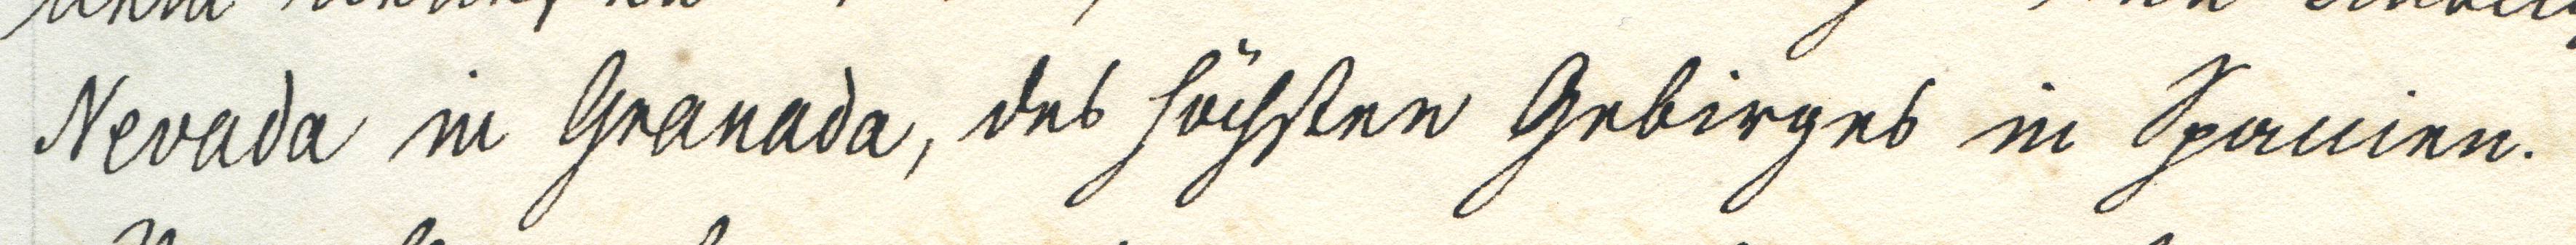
Nevada in Granada, des höchsten Gebirges in Spanien.
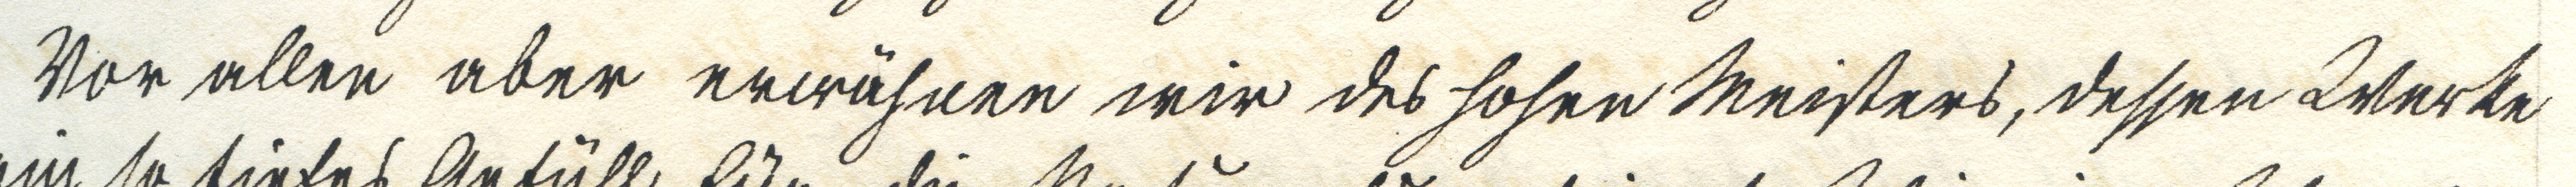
Vor allen aber erwähnen wir des hohen Meisters, dessen Werke
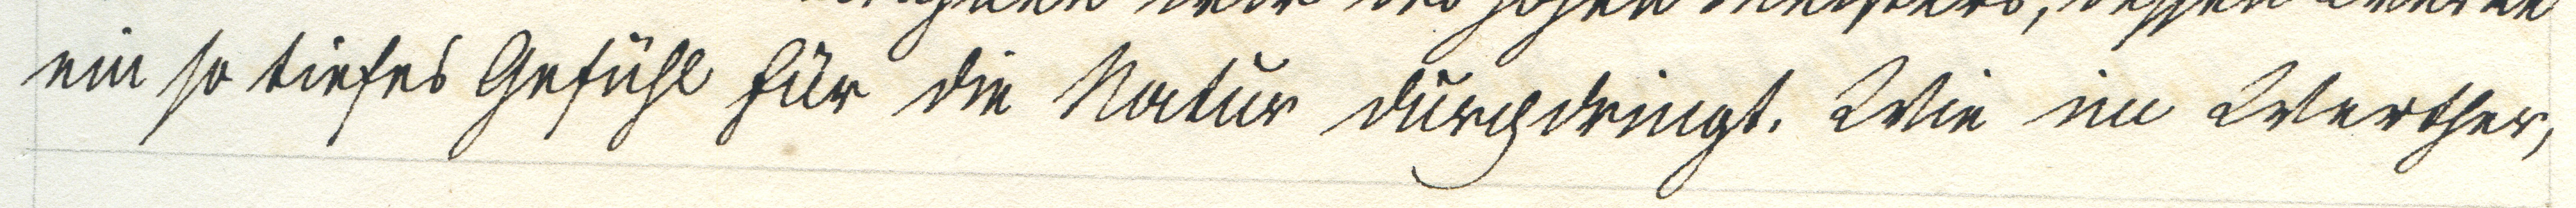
ein so tiefes Gefühl für die Natur durchdringt. Wie im Werther,
